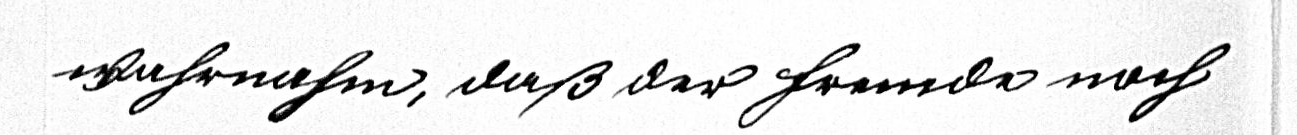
wahrnahm, daß der fremde noch
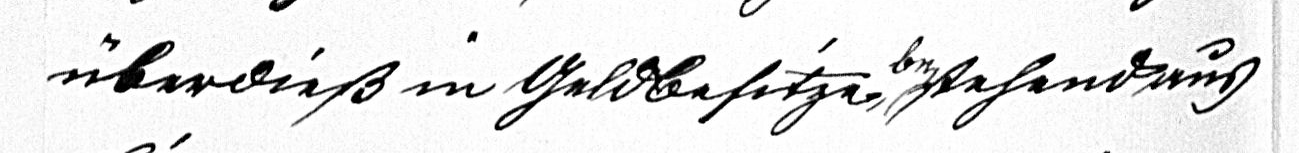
überdieß in Geldbesitze, bestehendaus
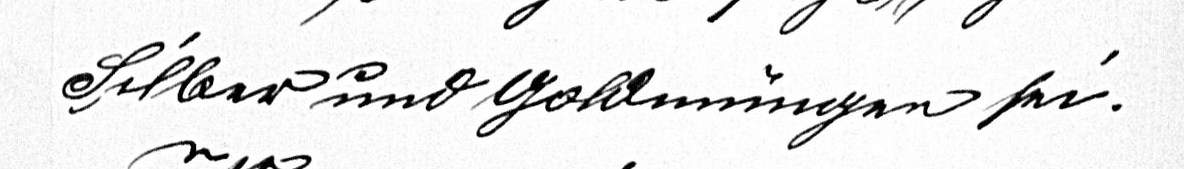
Silber und Goldmünzen sei.
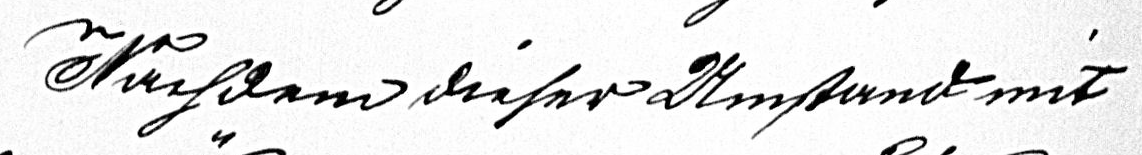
Nachdem dieser Umstand mit
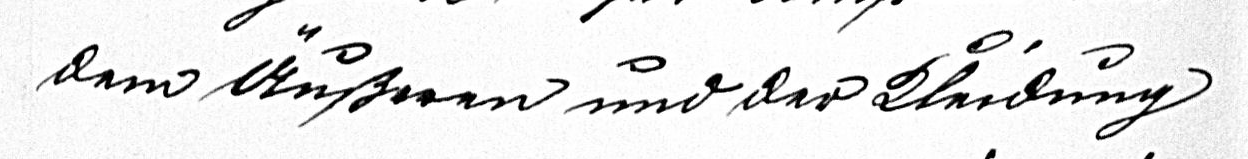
dem Äußeren und der Kleidung
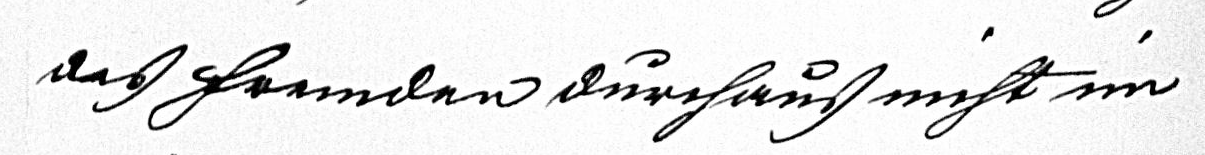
das fremden durchaus nicht im
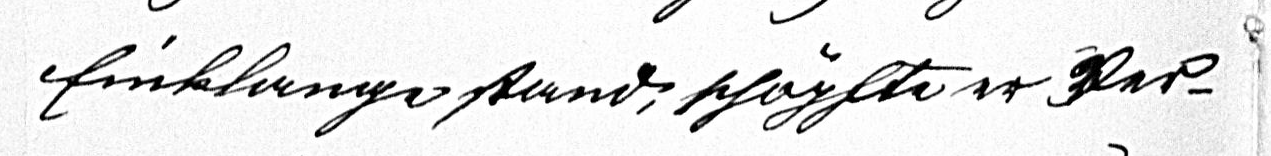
Einklange stand, schöpfte er Ver¬
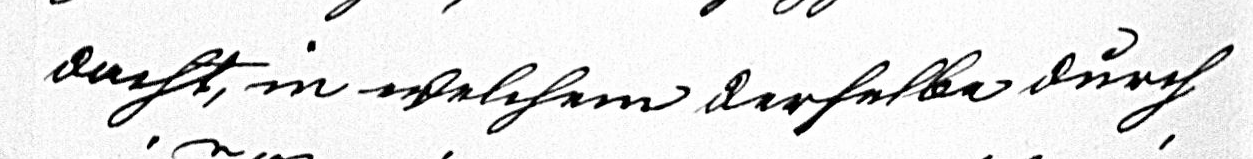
dacht, in welchem derselbe durch
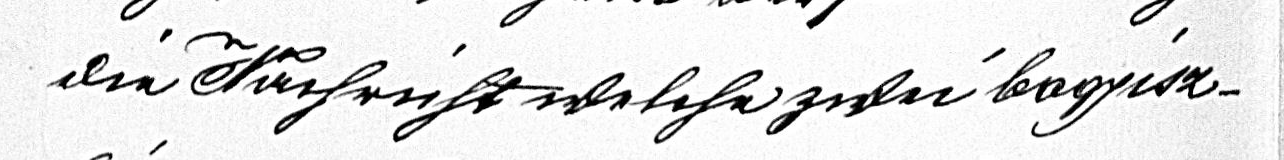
die Nachricht welche zwei bogyisz¬
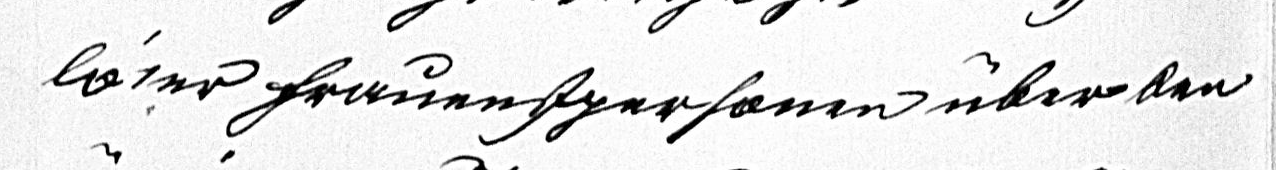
xx Frauenspersonen über den
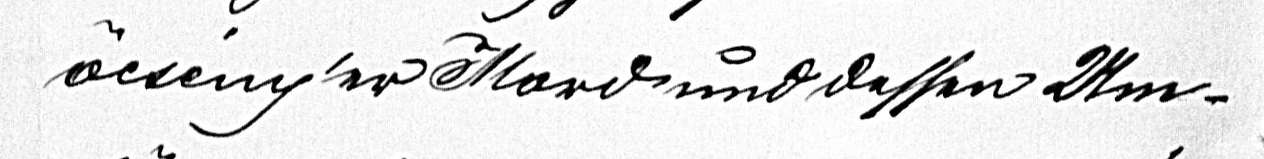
öcsénch'er Mord und dessen Um¬
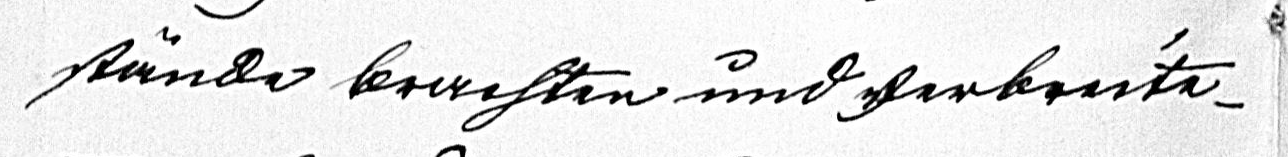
stände brachten und verbreite¬
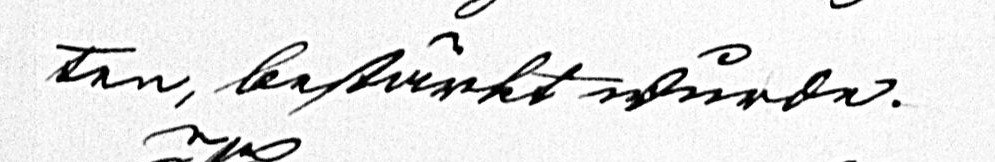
ten, bestärkt wurde.
